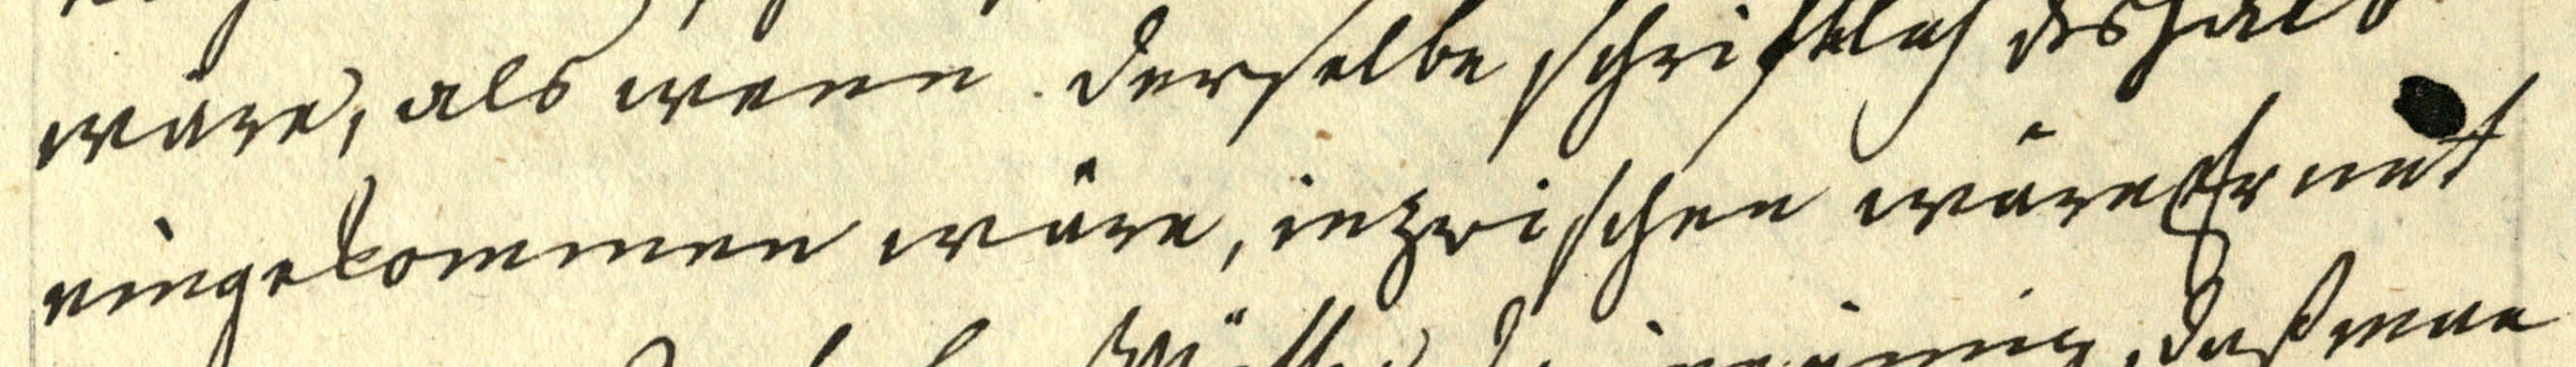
eingekommen wäre, inzwischen wäre Er mit
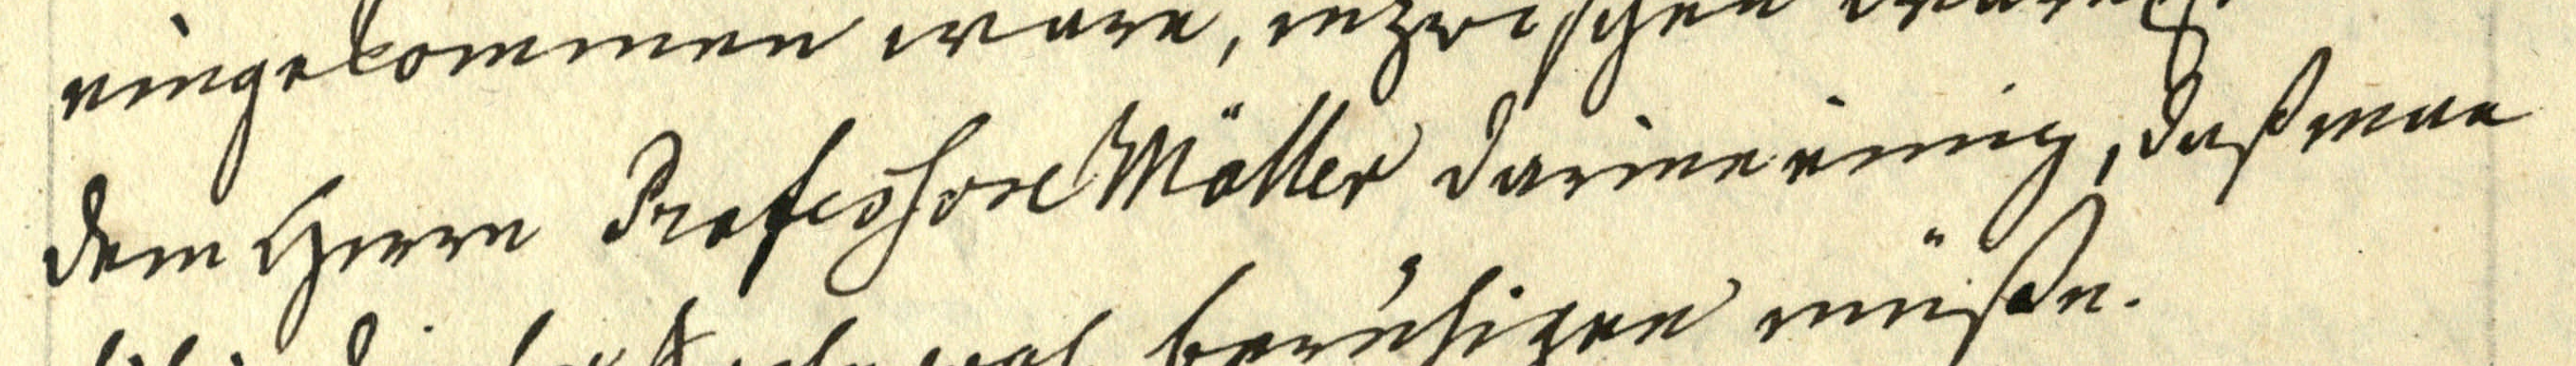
dem Herrn Professore Möller darin einig, daß man
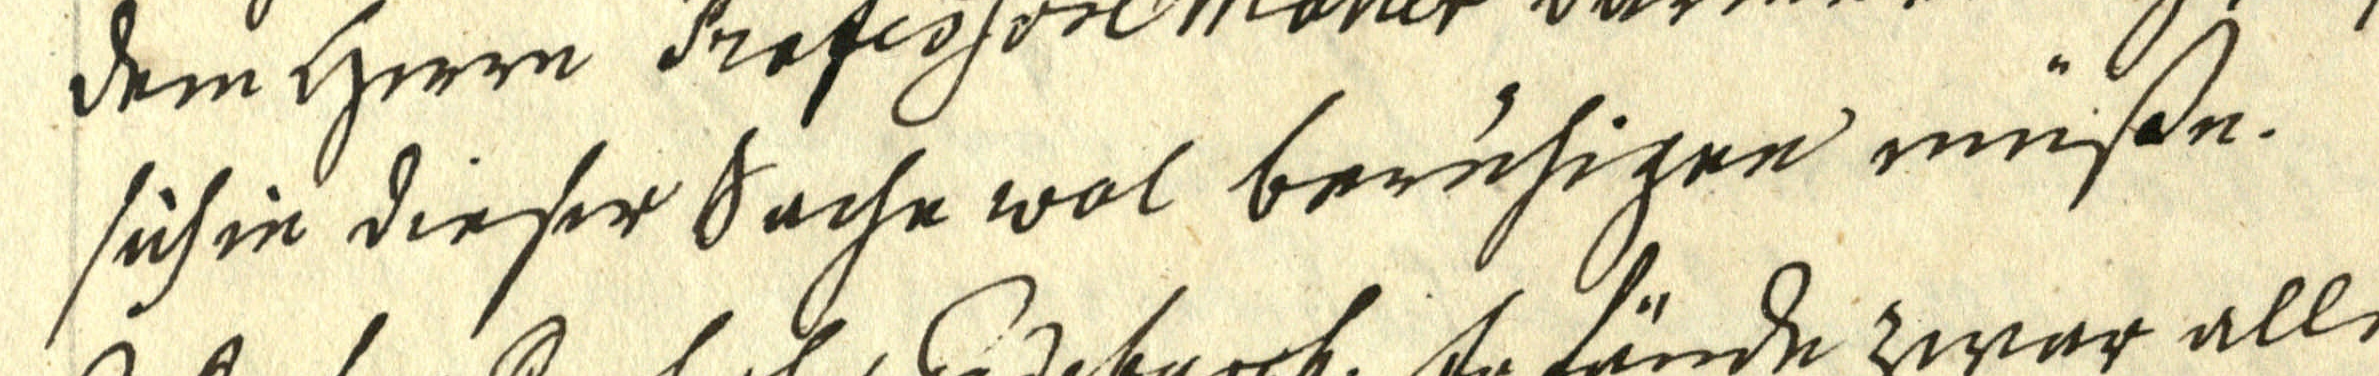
sich in dieser Sache wol beruhigen müße.
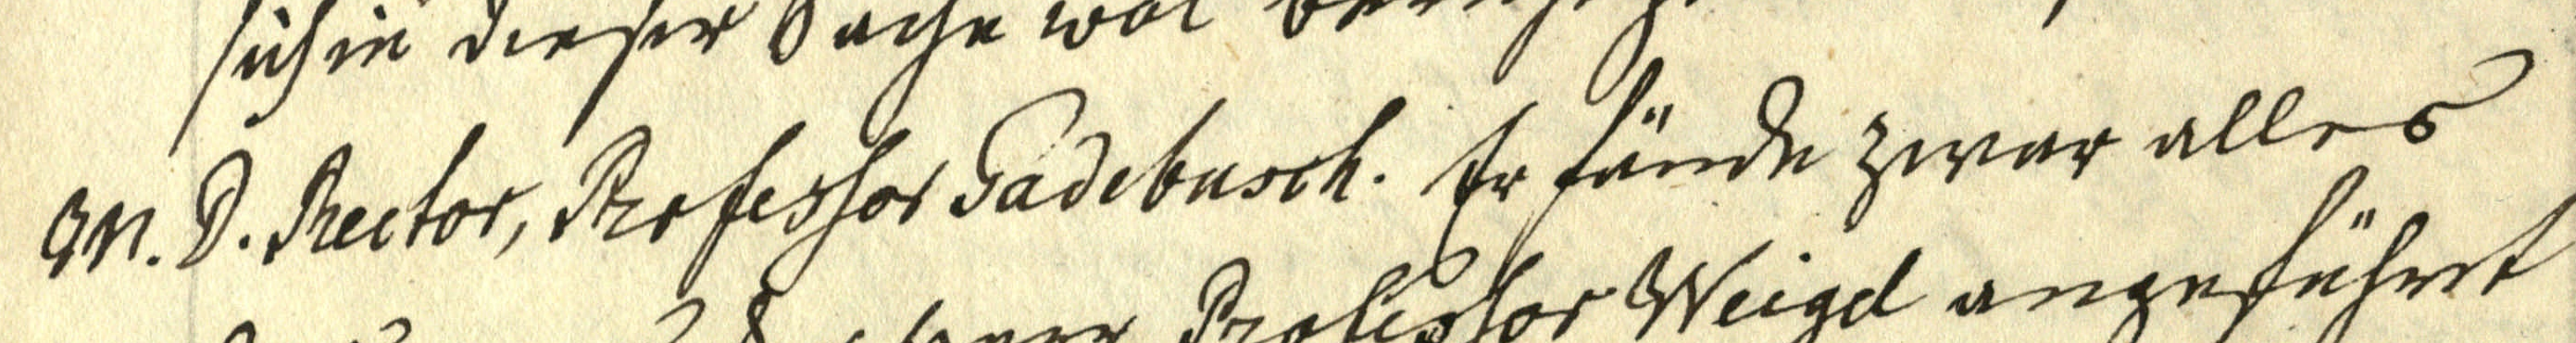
M. D. Rector, Professor Gadebusch. Er fände zwar alles
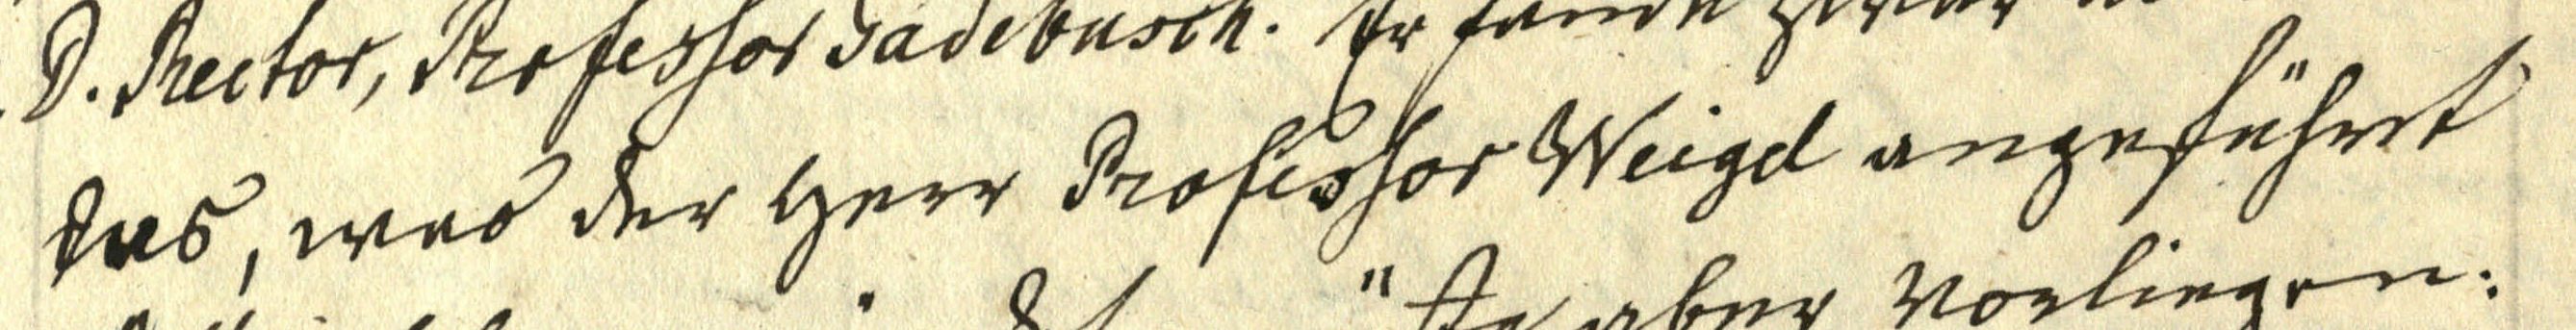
das, was der Herr Professor Weigel angeführet
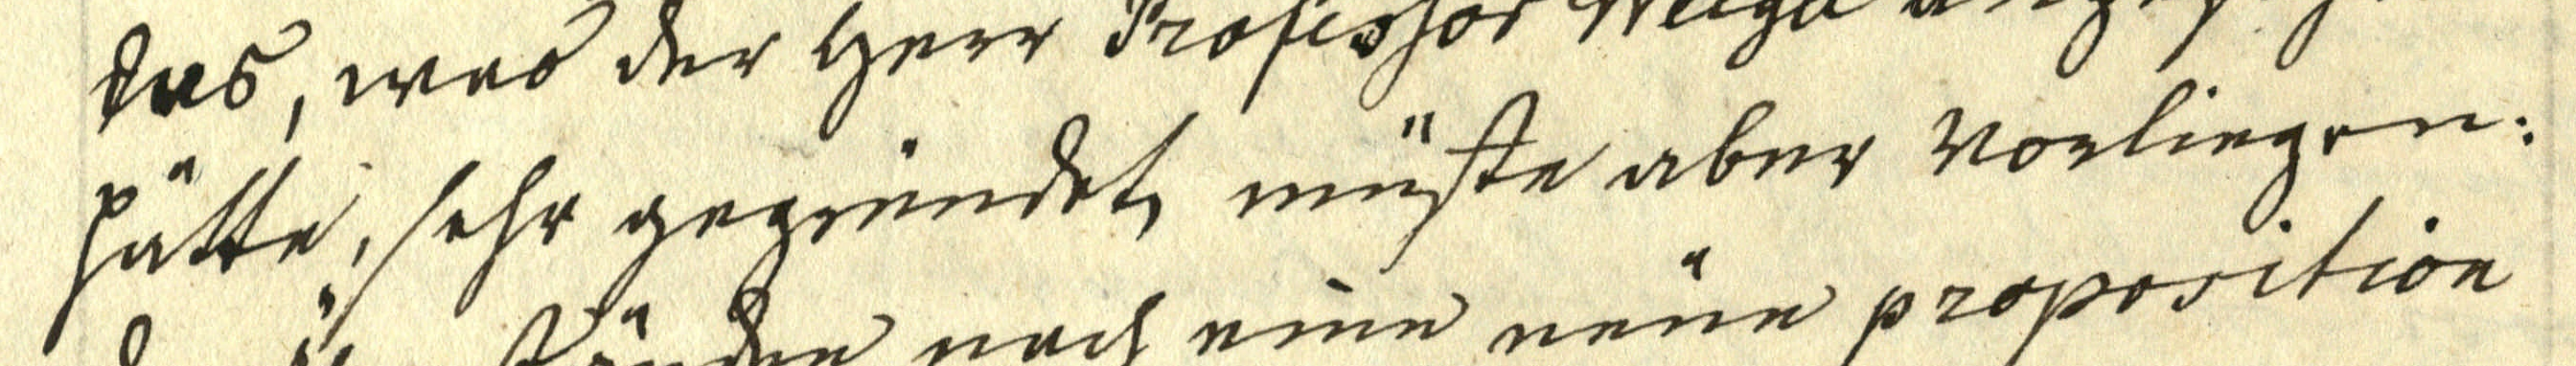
hätte, sehr gegründet, müßte aber vorliegen¬
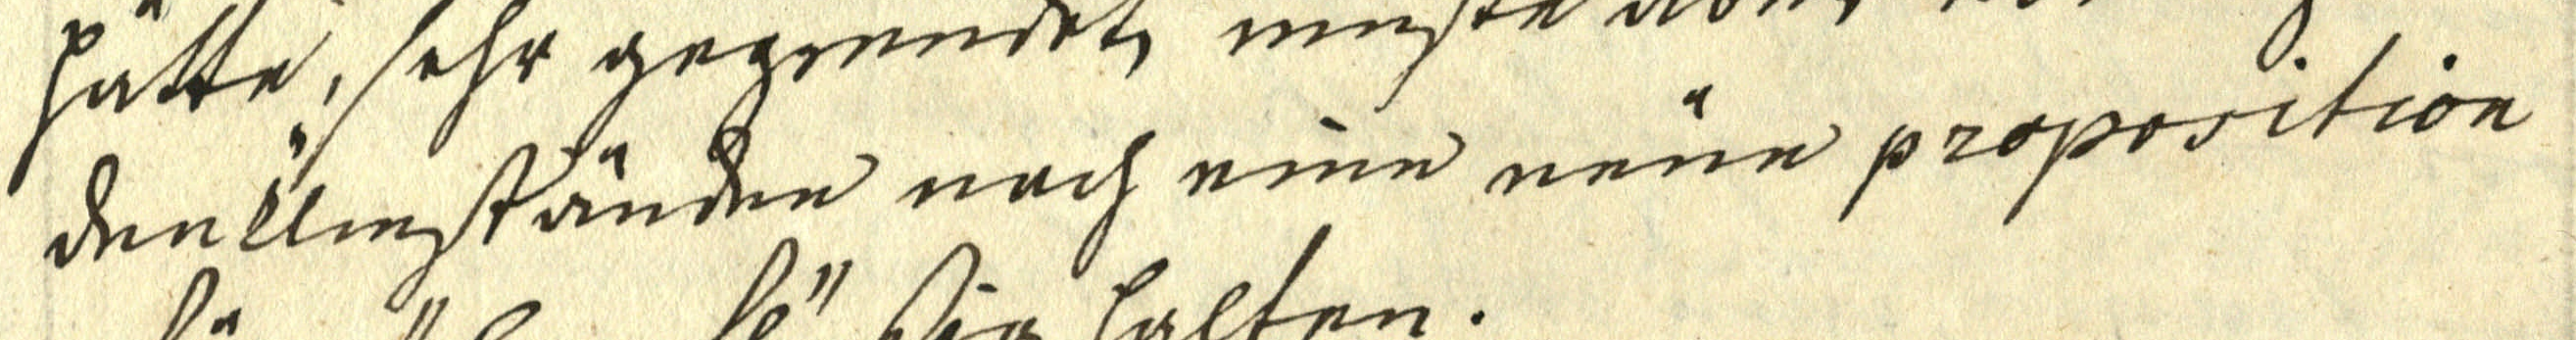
den Umständen nach eine neue proposition
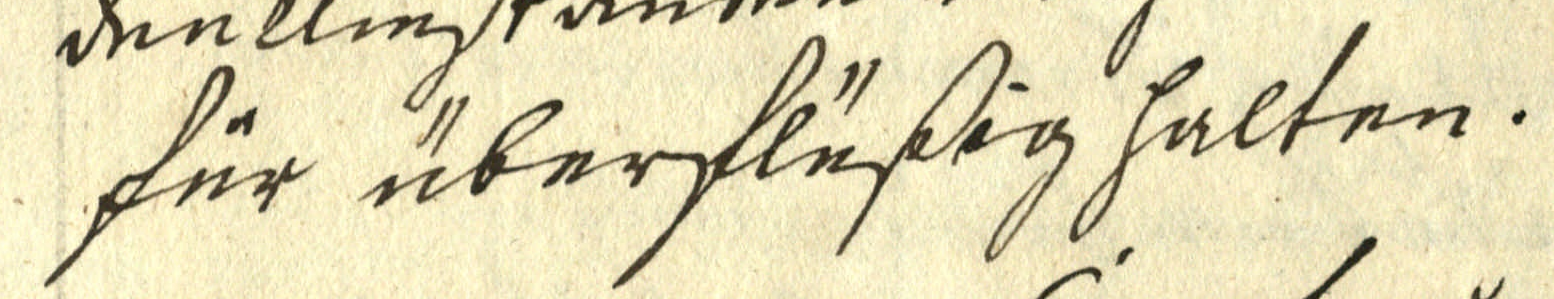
für überflüßig halten.
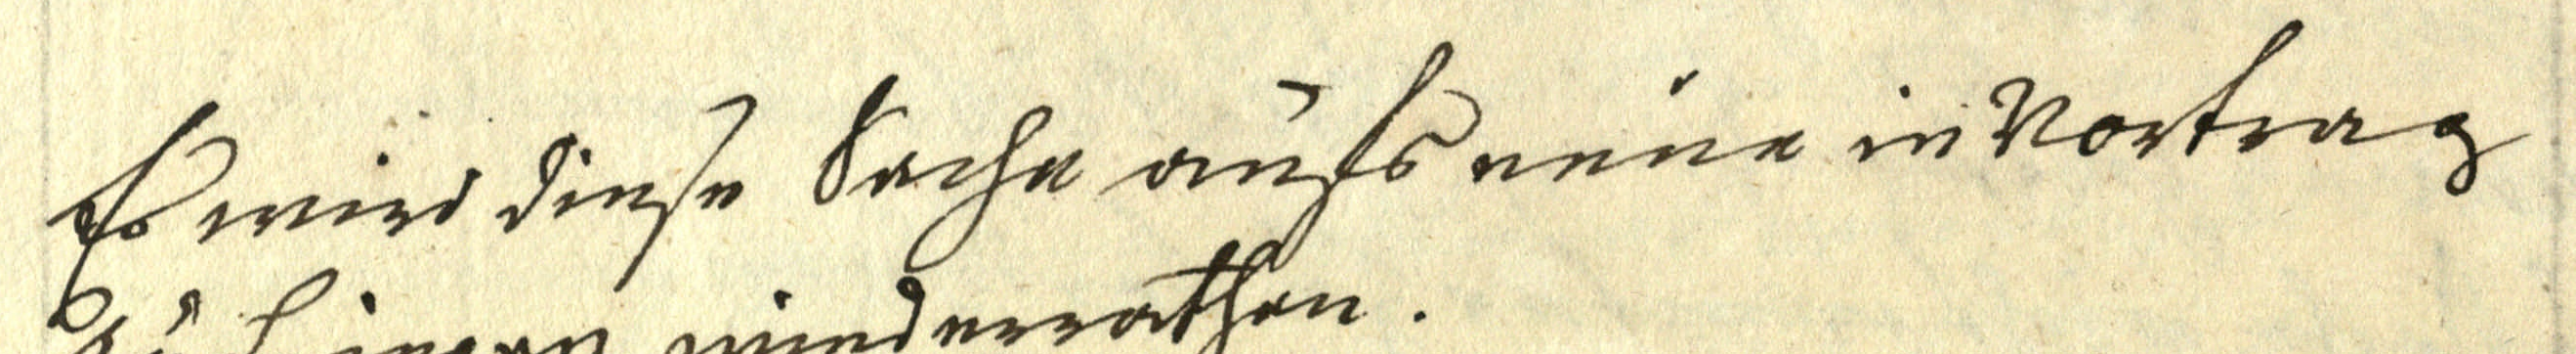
Es wird diese Sache aufs neue in Vortrag
